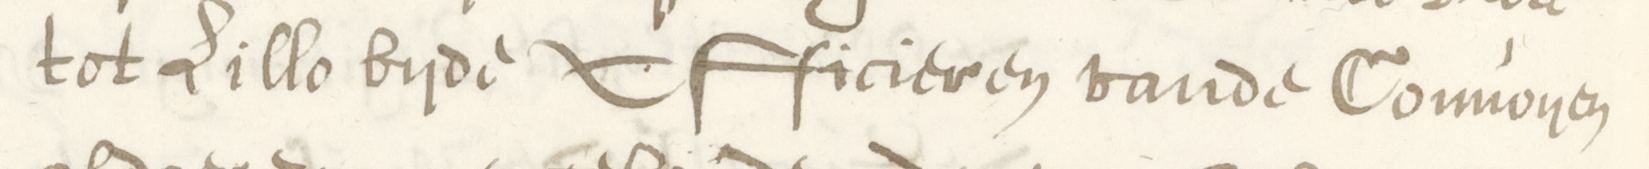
tot Lillo byde Officieren vande Conuoyen
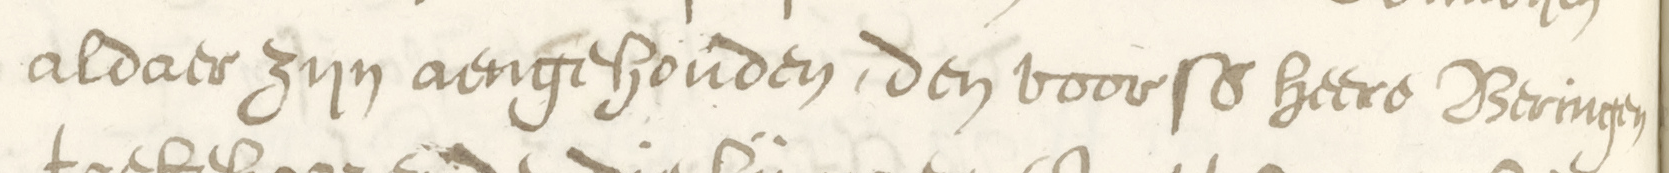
aldaer zyn aengehouden, den voors heere Beringen
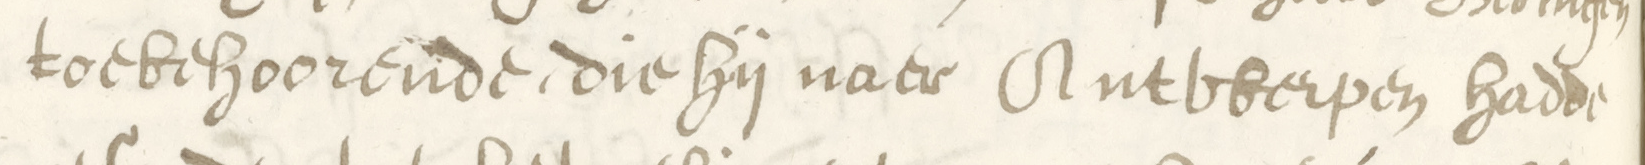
toebehoorende, die hij naer Antwerpen hadde
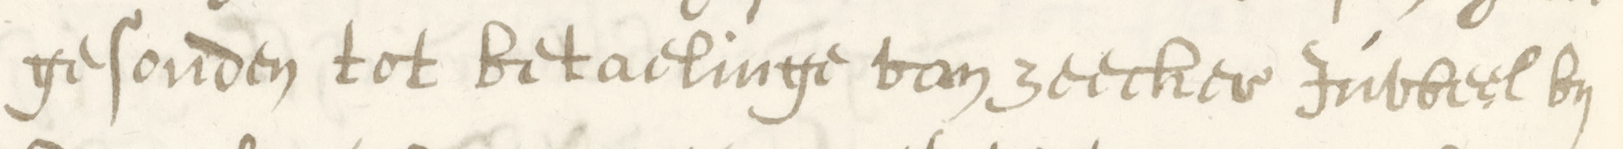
gesonden tot betaelinge van zeecker Juweel by
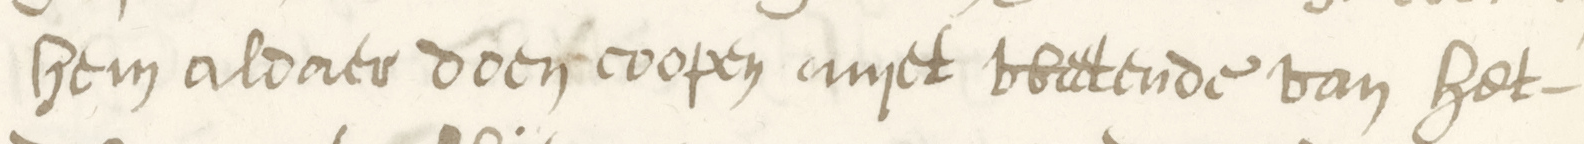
hem aldaer doen coopen nyet weetende van het
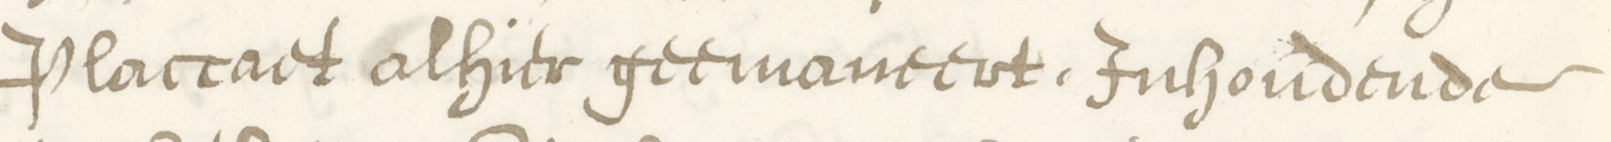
Placcaet alhier geemaneert, Inhoudende
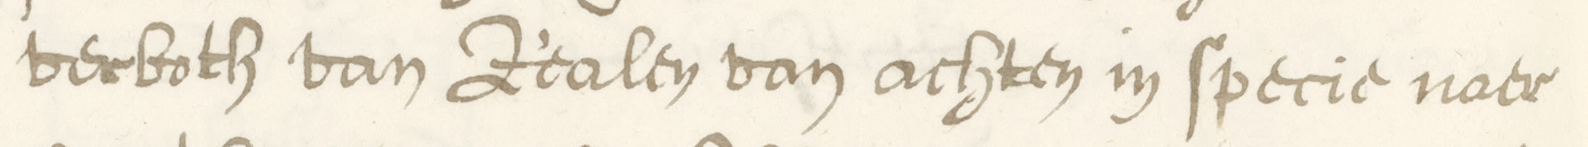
verboth van Realen van achten in specie naer
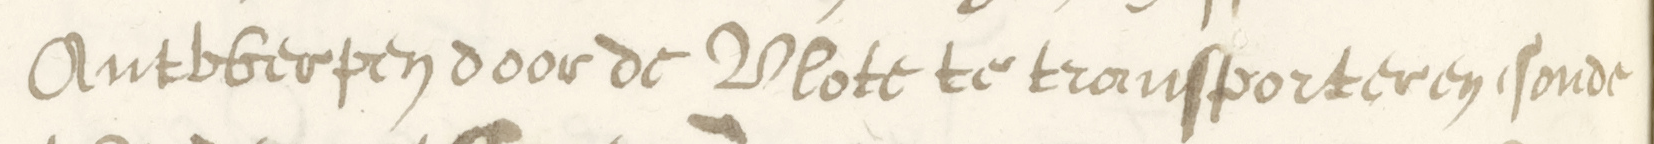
Antwerpen door de Vlote te transporteren, soude
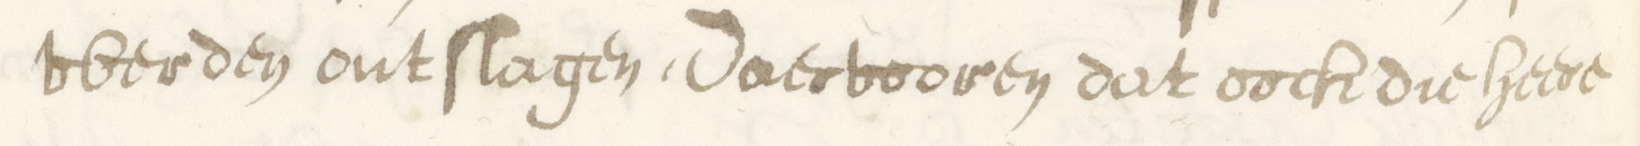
werden ontslagen, daervooren dat oock die heere
